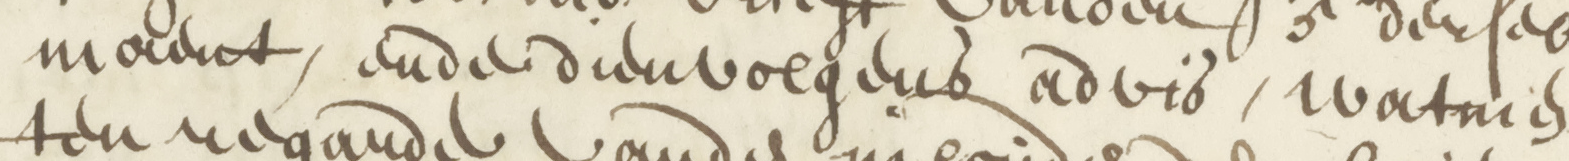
maent, ende dienvolgens advis, watmen
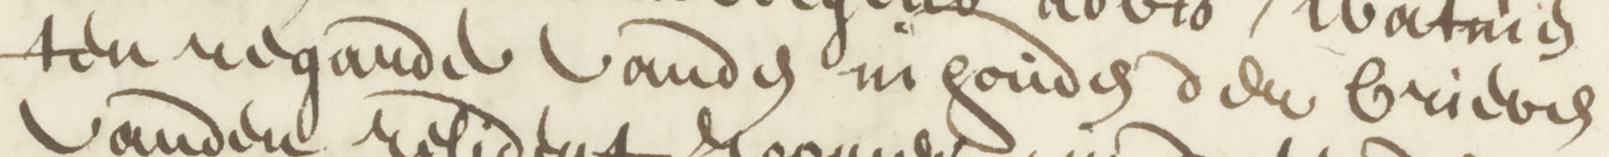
ten regarde vanden inhouden der brieven
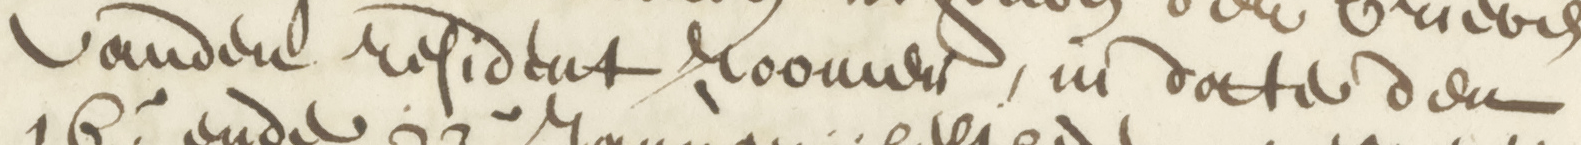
vanden resident Roomer, in date den
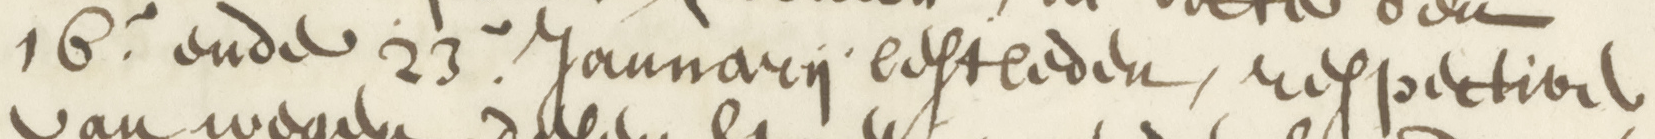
16e. ende 23e. Januarij lestleden, respective
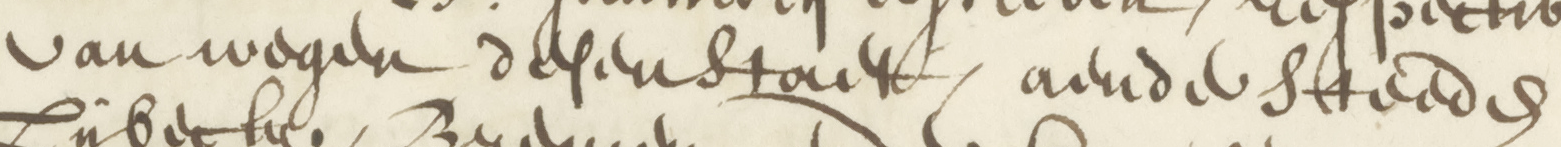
van wegen desen Staet, aende Steeden
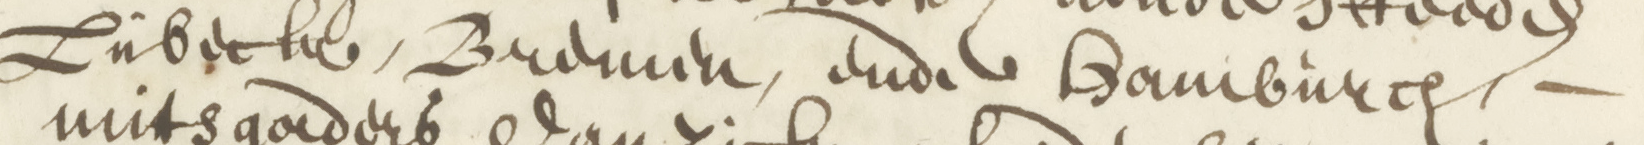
Lubeck, Bremen, ende Hamburch —
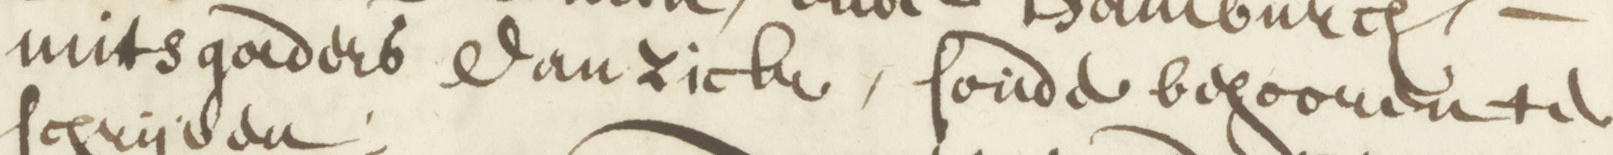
mitsgaders Danzick, soude behooren te
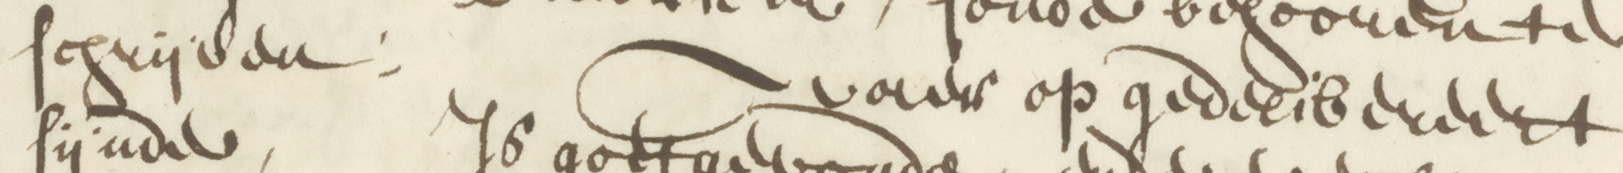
schrijven: Waer op gedelibereert
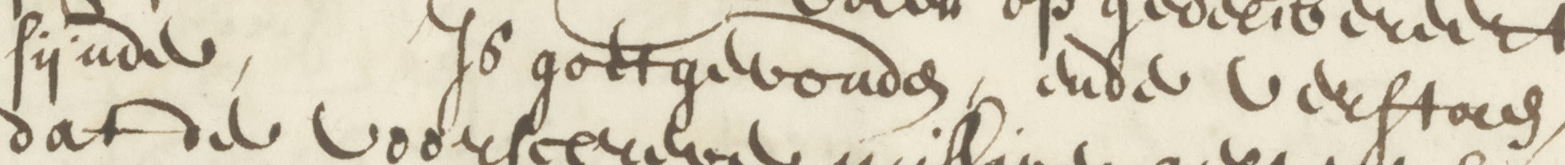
sijnde, Is goetgevonden, ende verstaen,
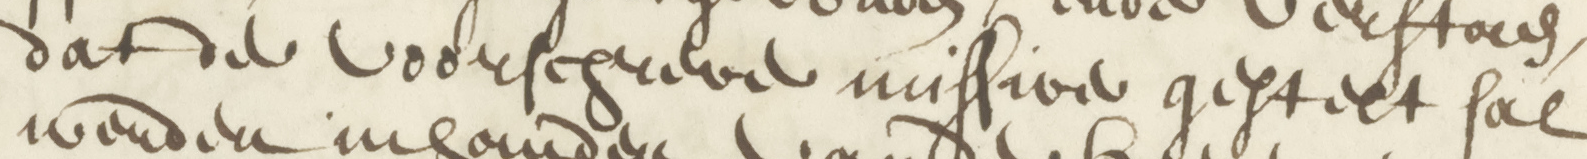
dat de voorschreve missive gestelt sal
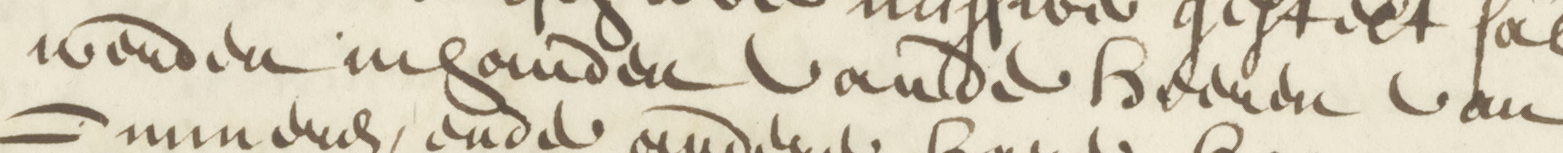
werden in handen vande heeren van
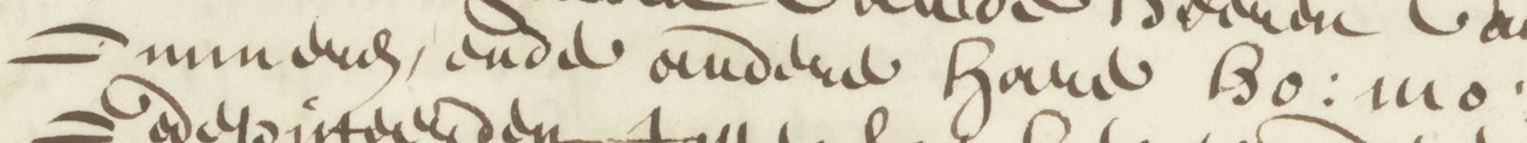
Ommeren, ende andere hare ho:mo:
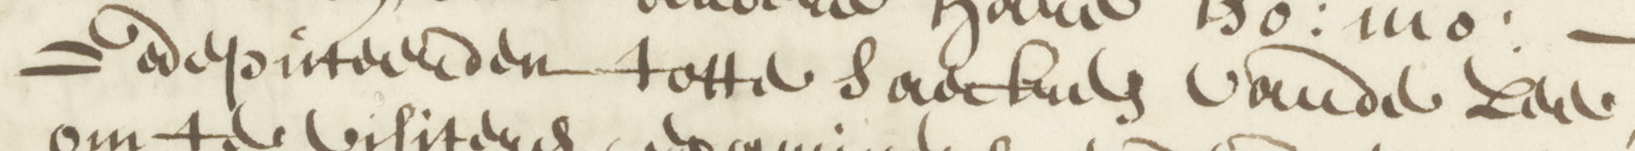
Gedeputeerden totte saecken vande Zee,
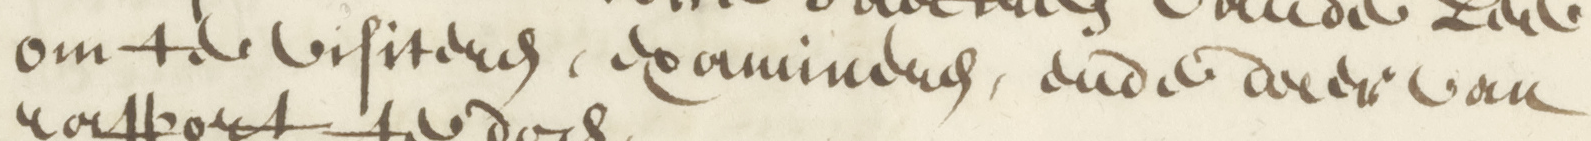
om te visiteren, examineren, ende daer van
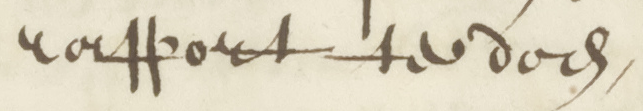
rapport te doen.
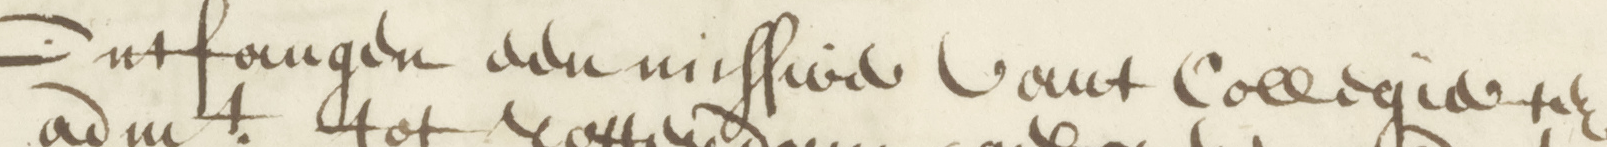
Ontfangen een missive vant Collegie ter
